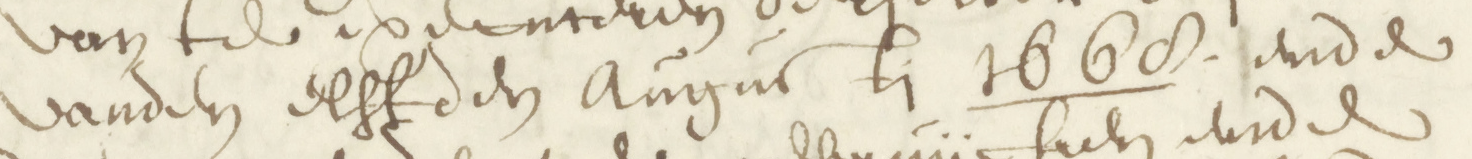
vanden elffden Augusti 1668. ende
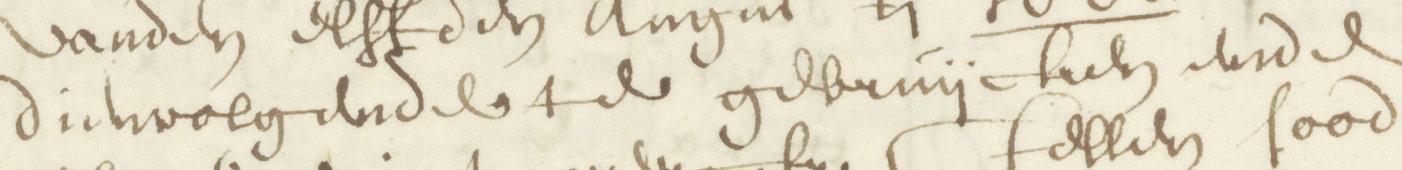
dienvolgende te gebruijcken ende
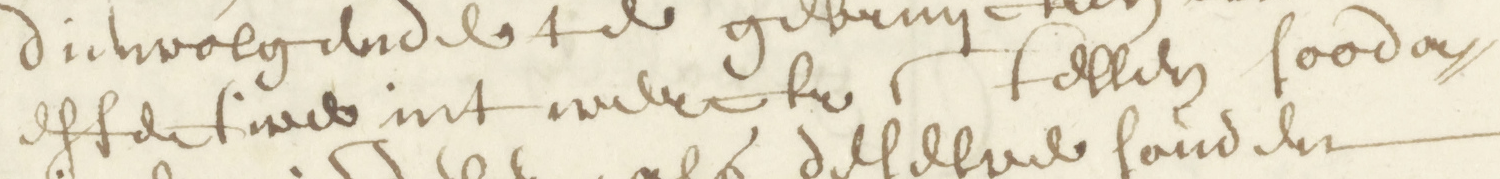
effective int werck stellen sooda„
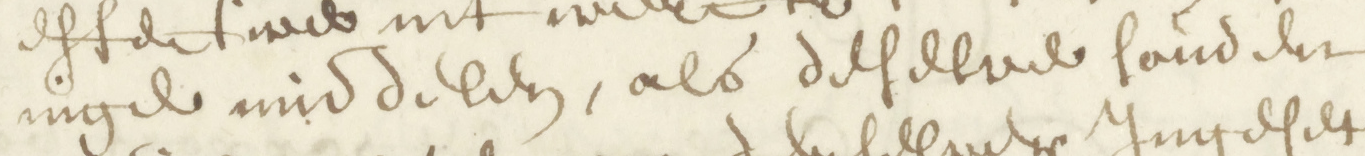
nige middelen, als deselve souden
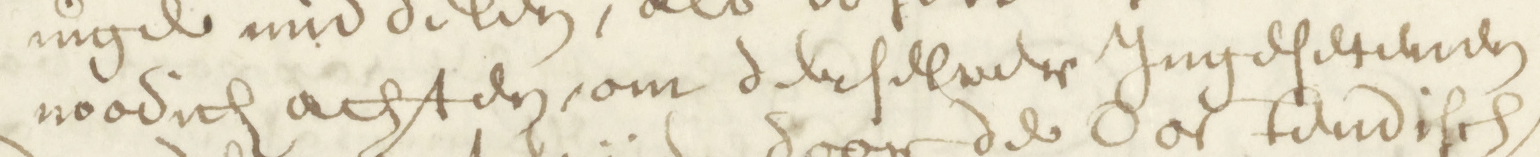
noodich achten, om derselver Ingesetenen
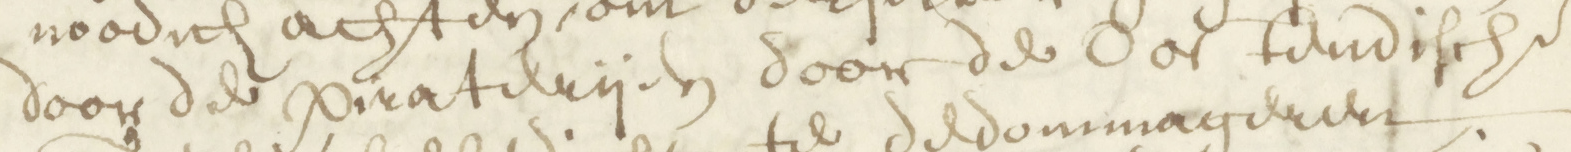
door de piraterijen door de Oostendische
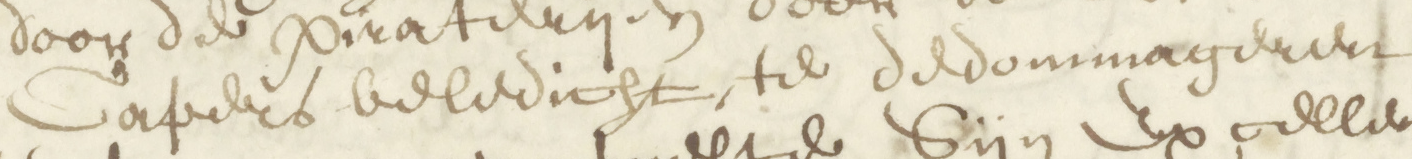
Capers beledicht, te dedommageren,
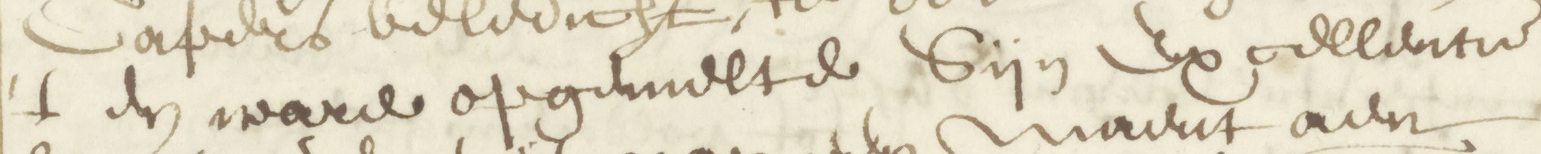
‛t en ware opgemelte Sijn Excellentie
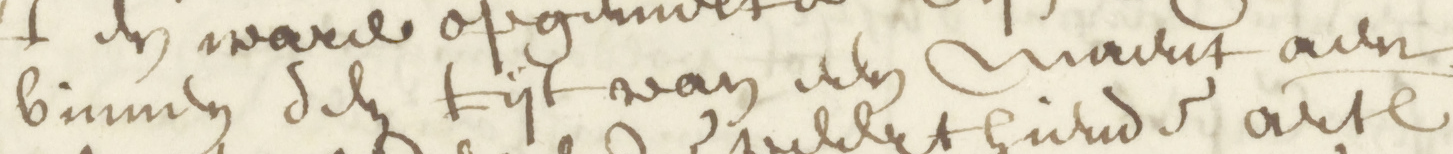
binnen den tijt van een Maent aen
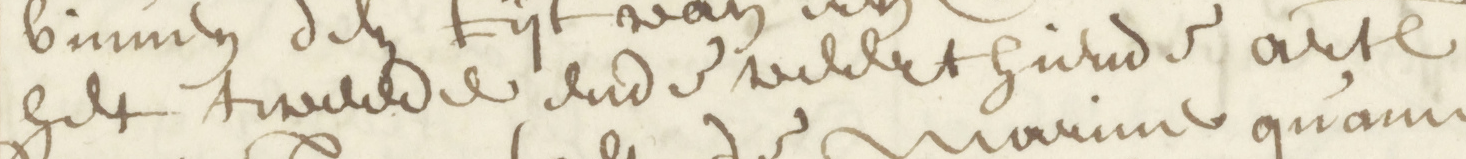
het tweede ende veerthiende artl
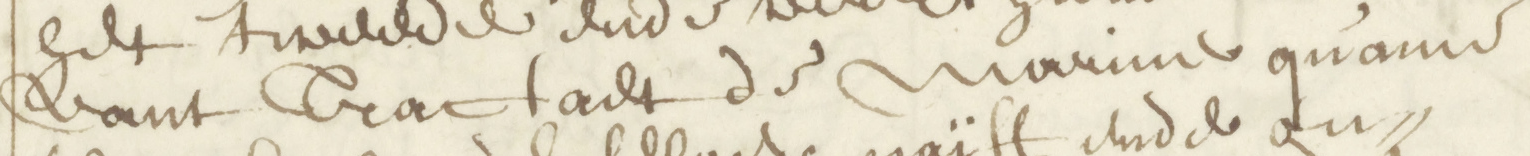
vant Tractaet de Marine quame
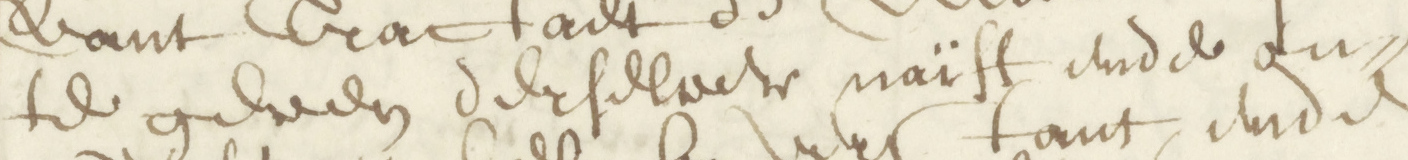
te geven derselver naϊff ende on„
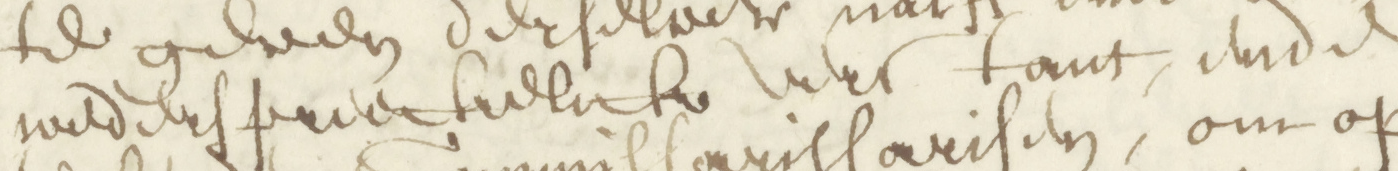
wederspreeckelick verstant, ende
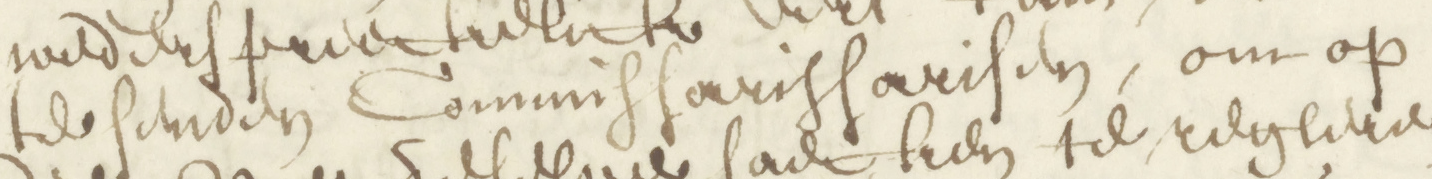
te schiden Commissarissarisen, om op
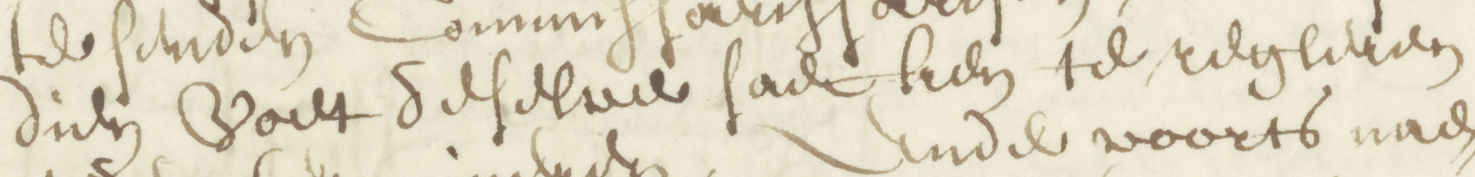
dien Voet deselve saecken te regleren
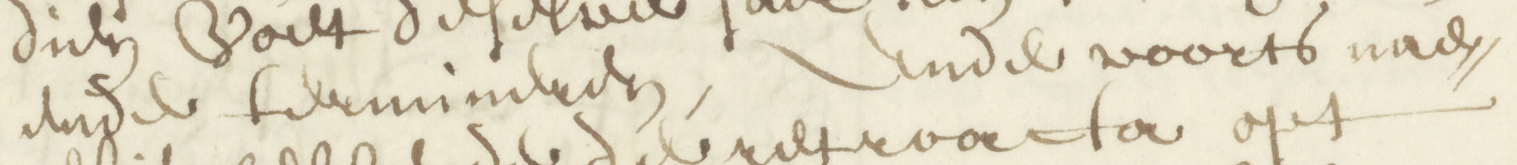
ende termineren. Ende voorts nae„
